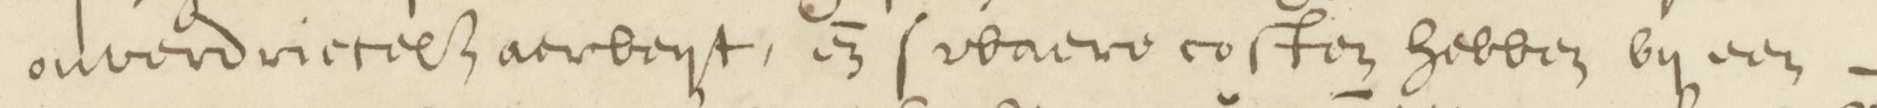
onverdrietel aerbeyt, en swaere costen hebben by een
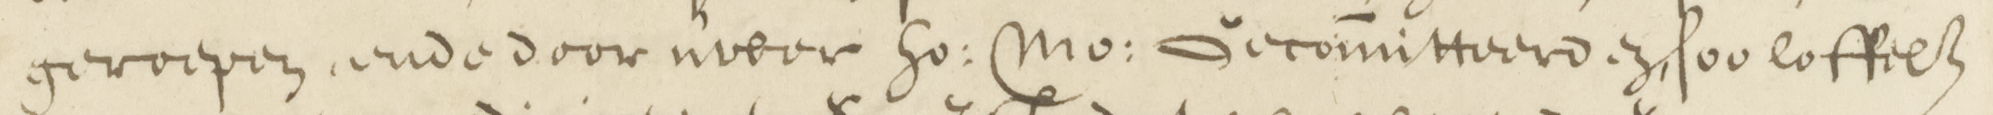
geroepen, ende door uwer ho:Mo: Gecomitteerden, soo loffel
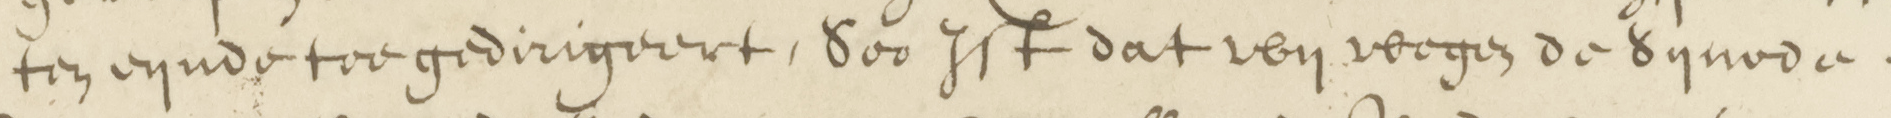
ten eynde toe gedirigeert, Soo Ist dat wy wegen de Synode
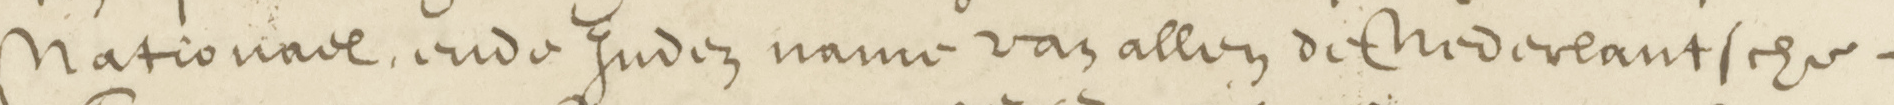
Nationael, ende Inden name van allen de Nederlantsche
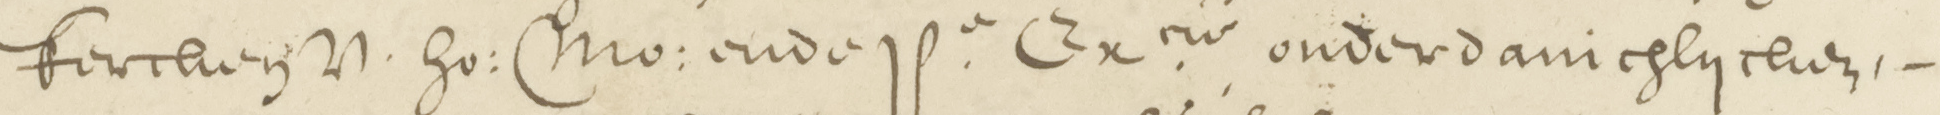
kercken U. ho:Mo: ende Pe. Excie onderdanichlycken,
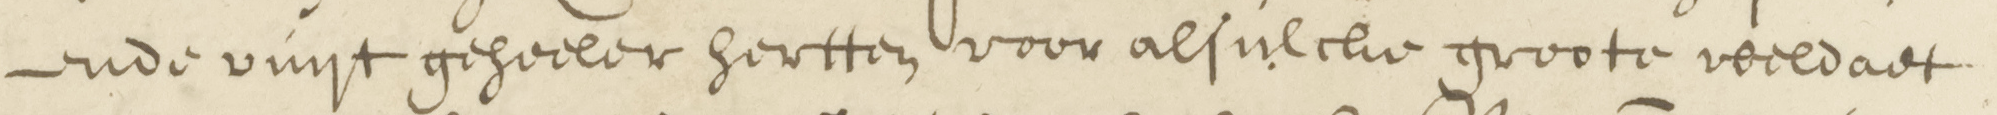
ende vuyt geheeler hertten voor alsulcke groote weldaet
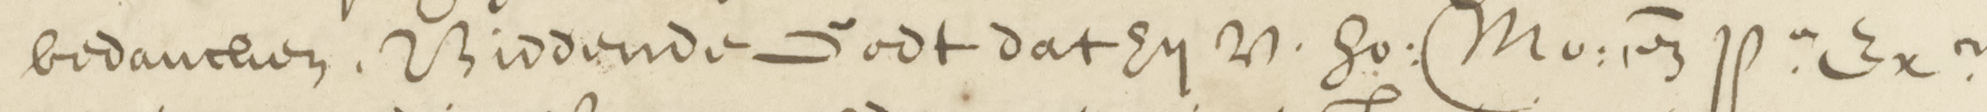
bedancken, Biddende Godt dat hij U. ho:Mo:, en Pe. Excie.
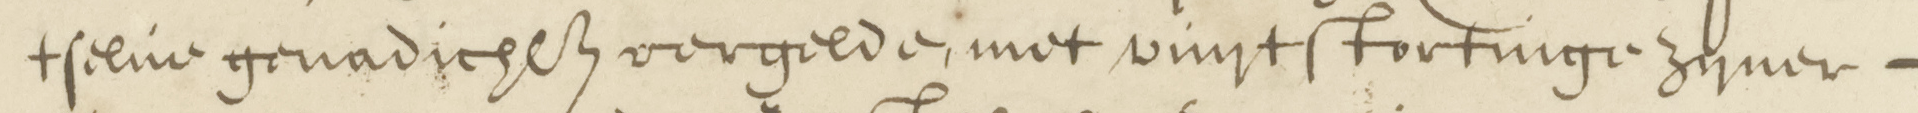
tselue genadichl vergelde, met vuytstortinge zyner
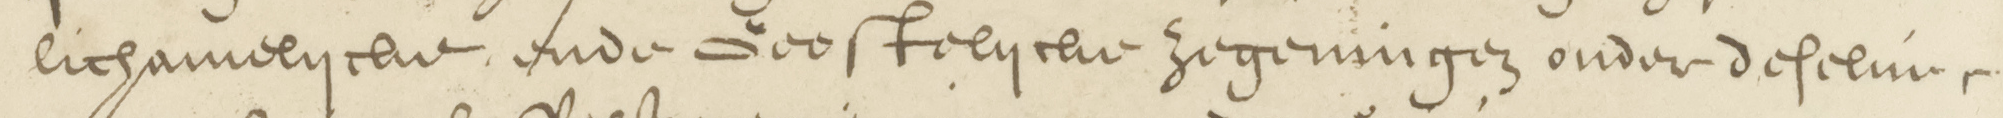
lichamelycke, ende Geestelycke zegeningen onder deselue
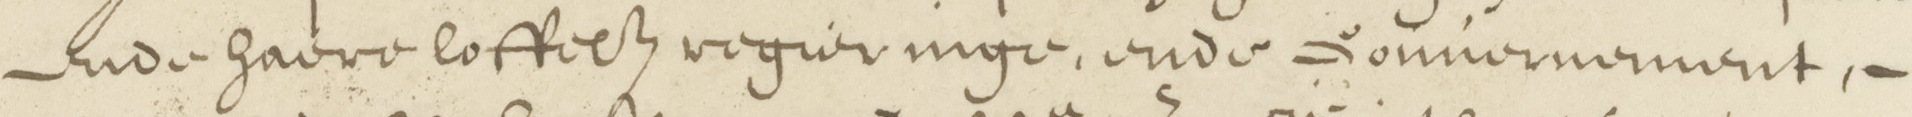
ende haere loffel regieringe, ende Gouuernement,
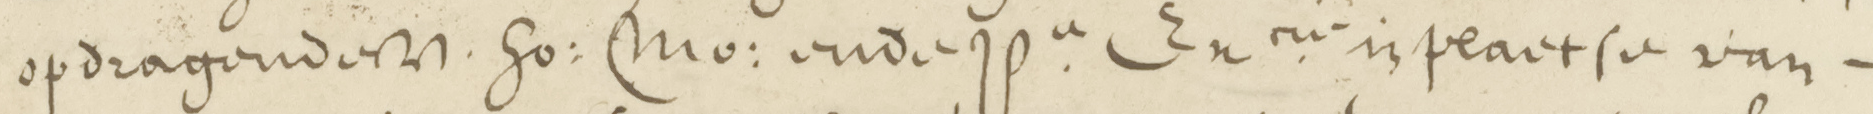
opdragende U. ho:Mo: ende Pe. Excie. in plaetse van
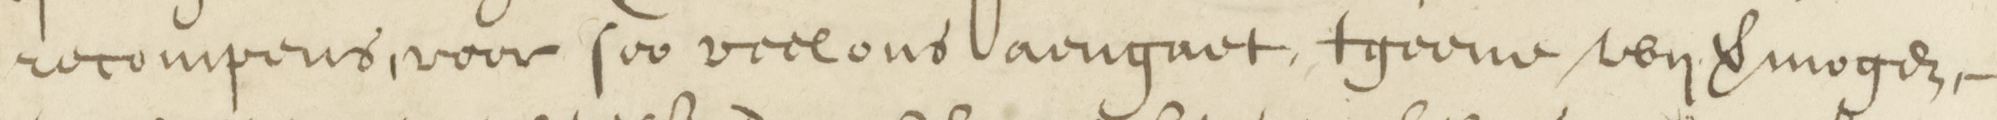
recompens, voor soo veel ons aengaet, tgeene wy &mogen,
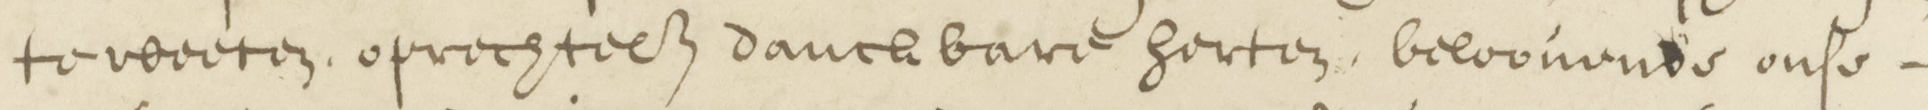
te weeten, oprechtel danckbare herten, beloonende onse
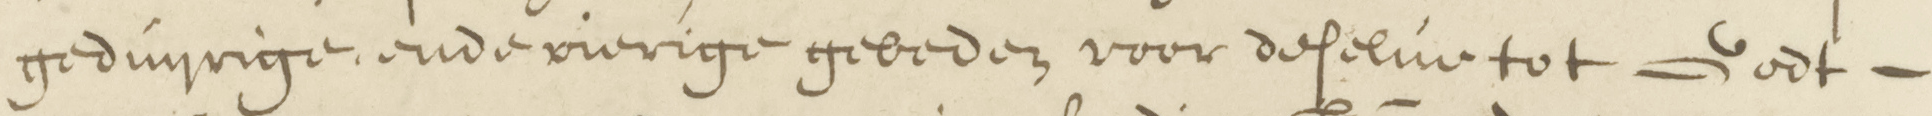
geduyrige, ende vierige gebeden voor deselue tot Godt
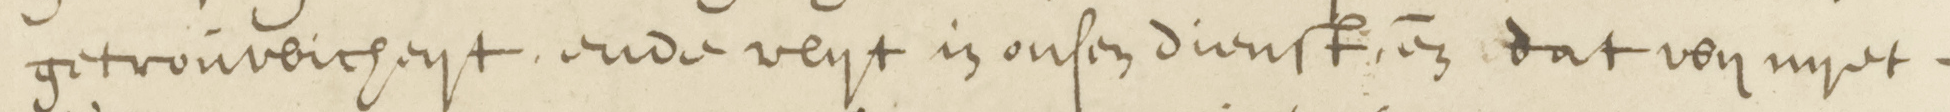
getrouwicheyt, ende vlyt in onsen dienst, en dat wy nyet
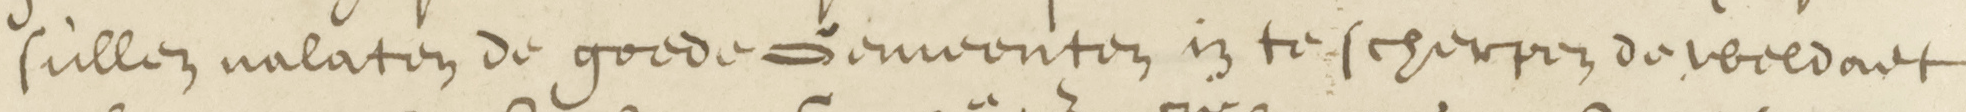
sullen nalaten de goede Gemeenten in te scherpen de weldaet
